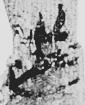或
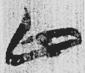㠯
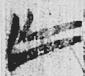亡
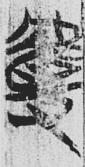○（且）
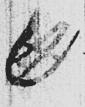臣
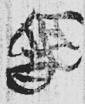○（聞）
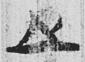之
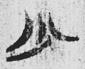少（小）
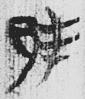邦
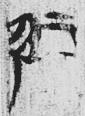○（處）
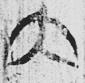大
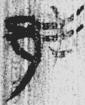邦
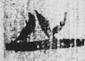之
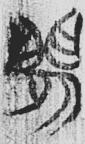○（閒）
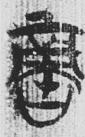啻
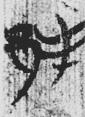邦
